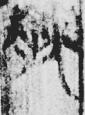肰（然）
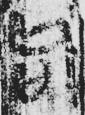句（後）
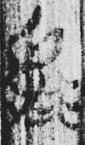能
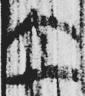立
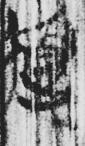道
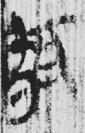○（聞）
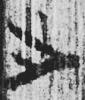之
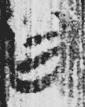曰
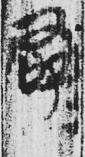君子
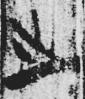之
